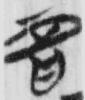音
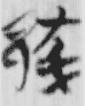○（蔡）
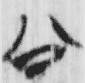公
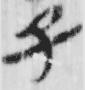子
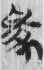○（家）
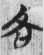各
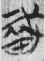戠
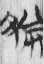豢
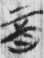酉（酒）
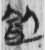○（食）
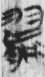○（一）
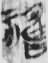禱
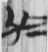於
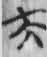夫
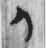人
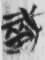戠
